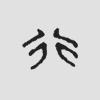行
